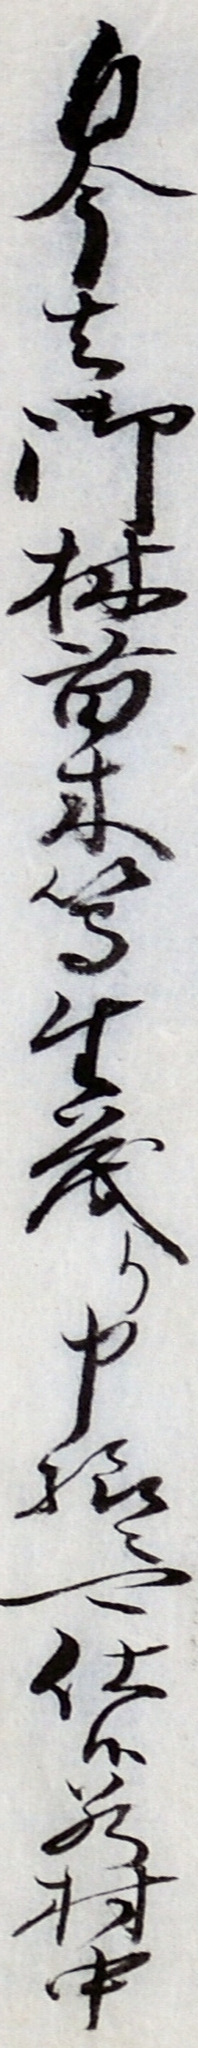自今は御林苗木等生茂り申様ニ可仕候若村中
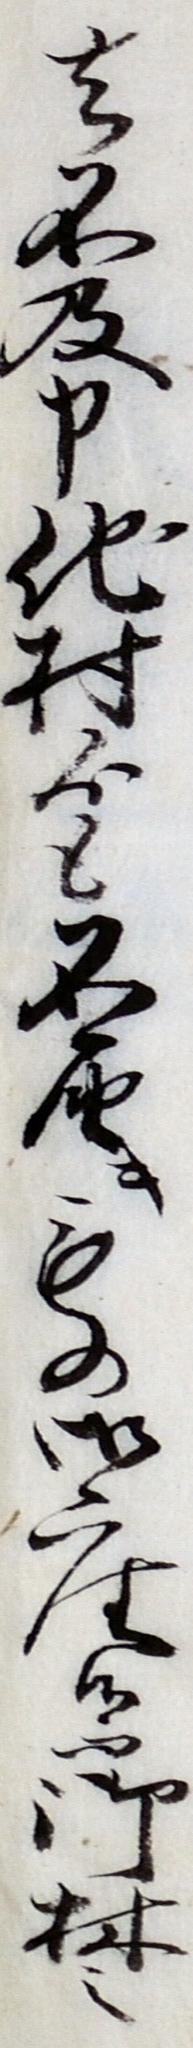は不及申他村ゟも不届キもの御座候而御林之
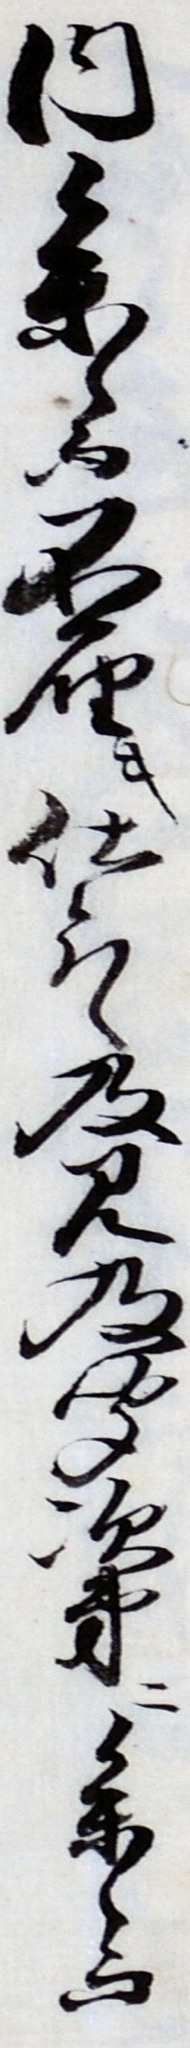内参候而不届キ仕候ハヽ及見及聞次第ニ参候而
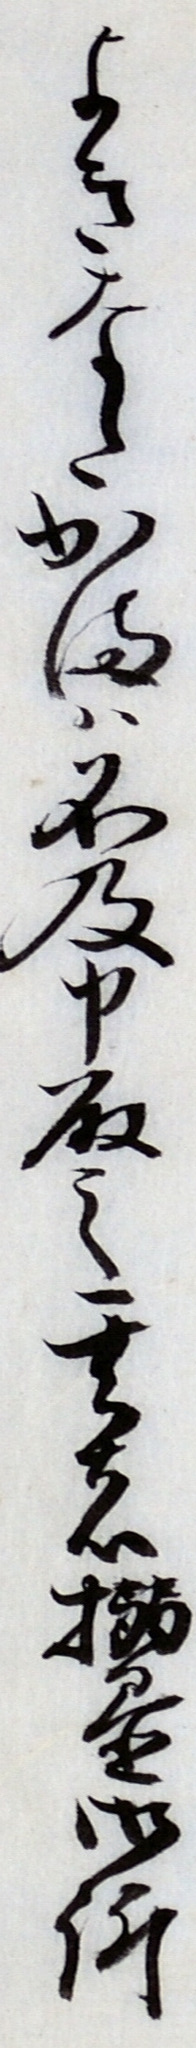よきなたかまハ不及申取之其者搦置御訴
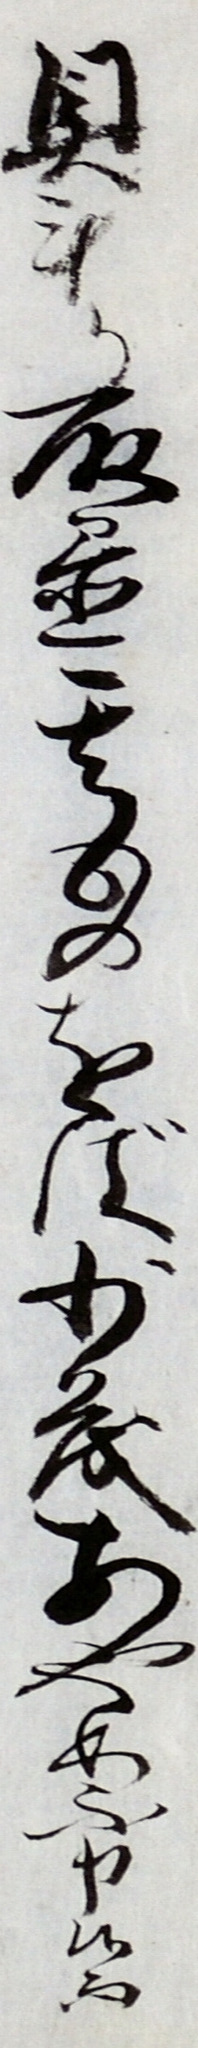具計り取置其ものをば少もあやめ不申候而
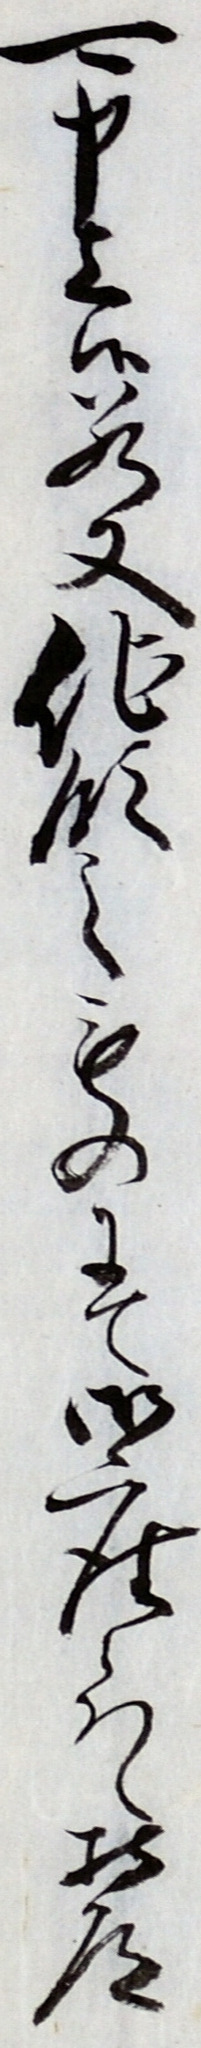可申上候若又他領之ものにて御座候ハヽ持道
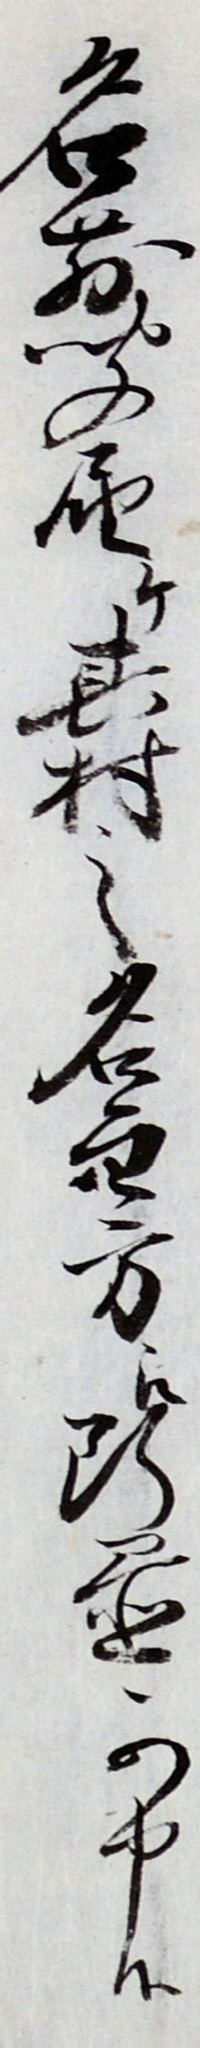名前聞届ヶ其村之名主方え断置可申候
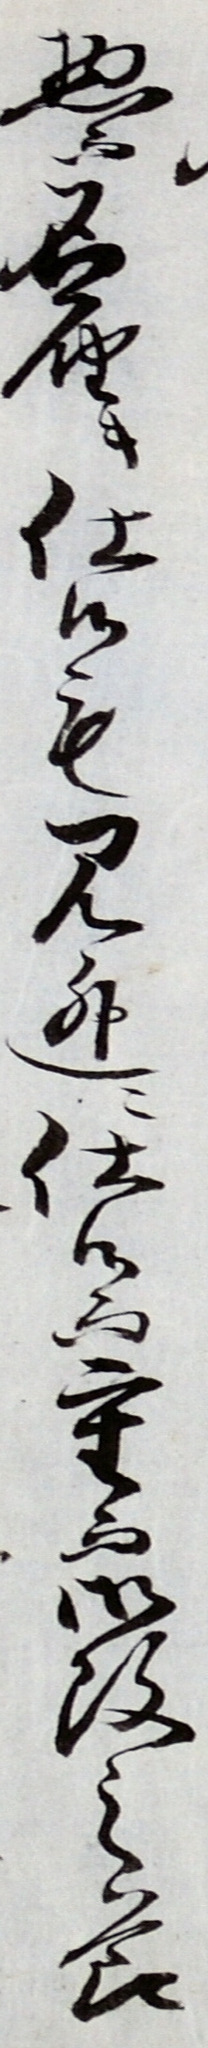惣而不届キ仕候も見逃ニ仕候而重而御改之節
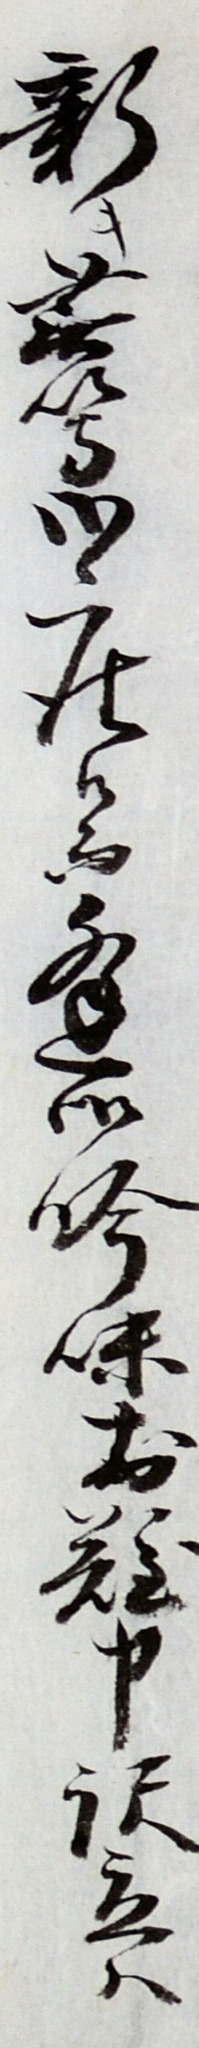新キ蕪等御座候而逢御吟味於難申訳立ハ
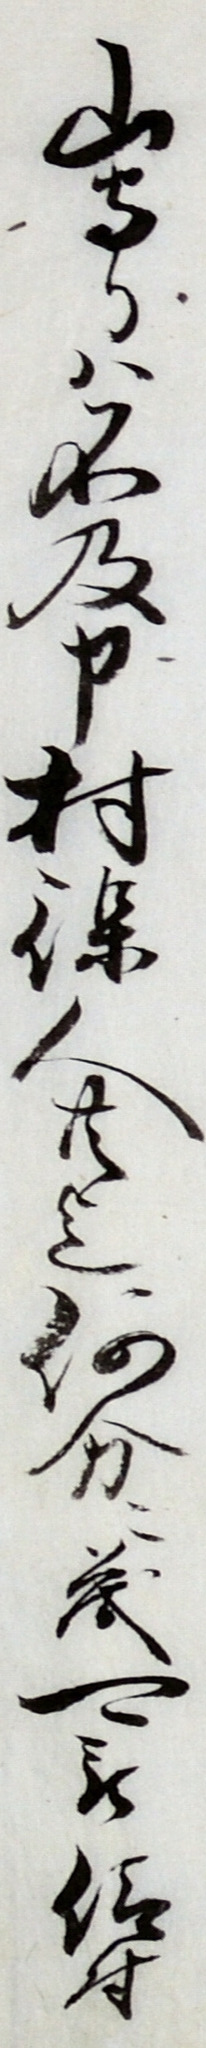山守りハ不及申村役人共迄何分ニも可被仰付

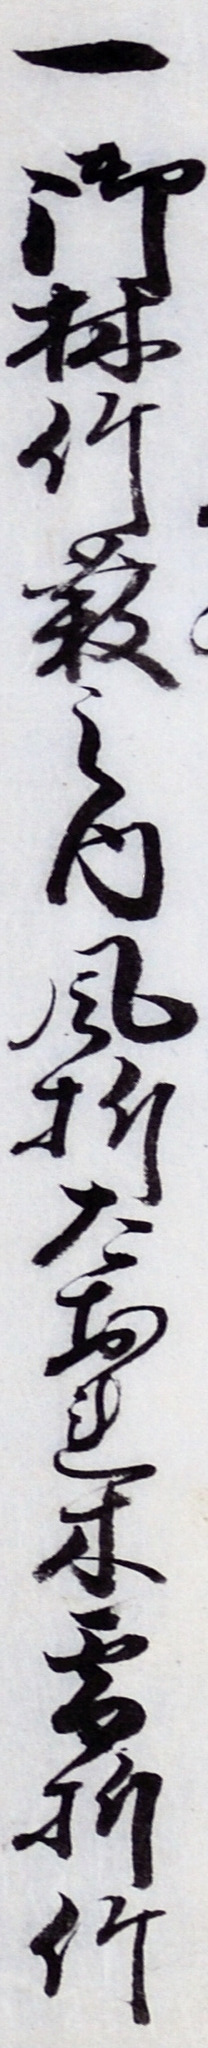一御林竹薮之内風折たおれ木雪折竹
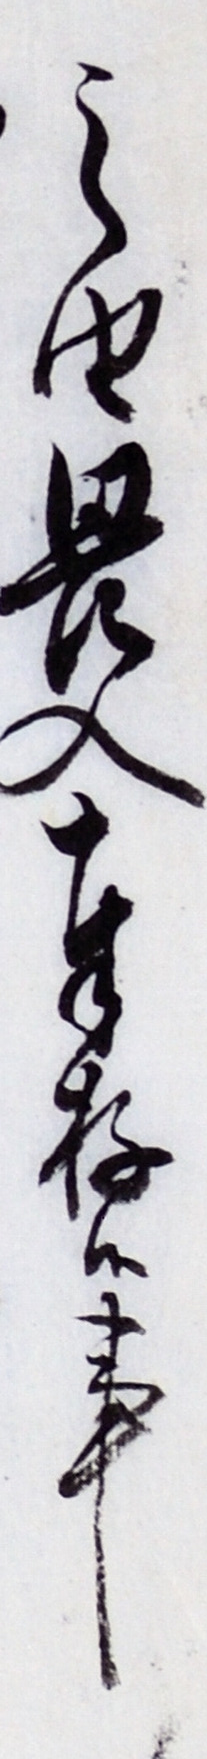之由畏入奉存候事
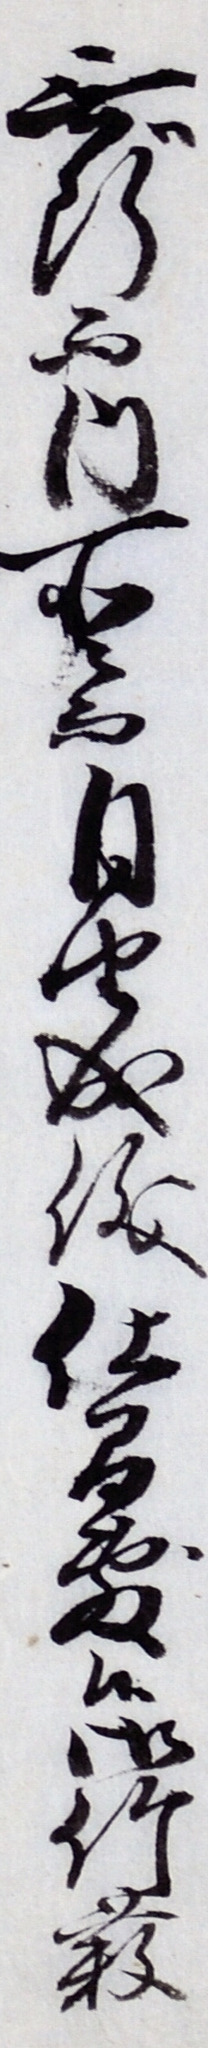無御断而内所ニ而自由成儀仕間敷候御竹薮
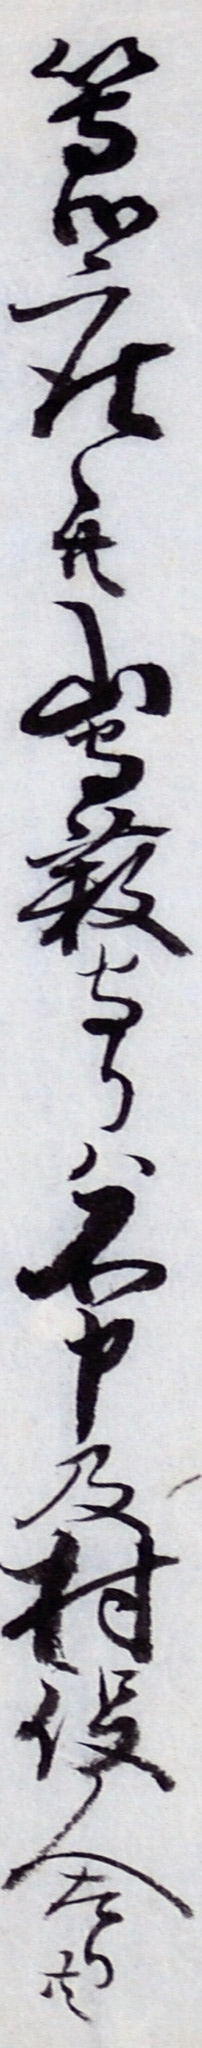等御座候共山守薮守りハ不申及村役人たり共
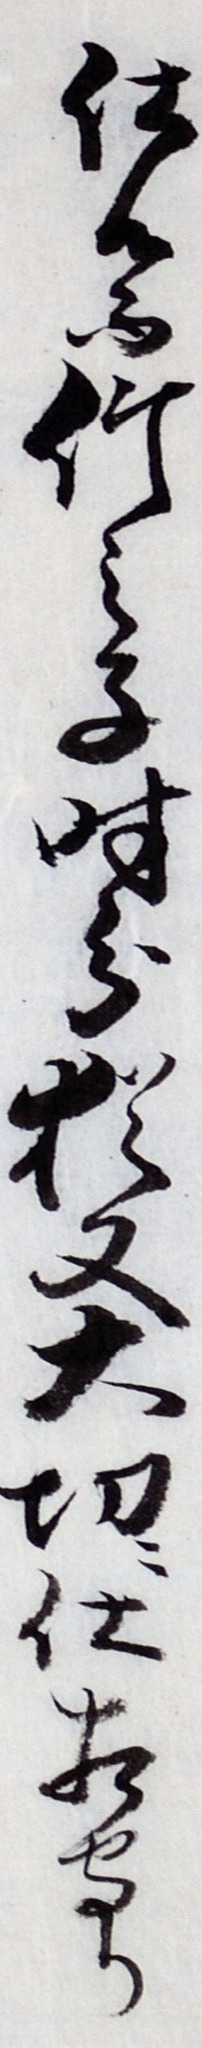仕候而竹之子時分猶又大切ニ仕相守り
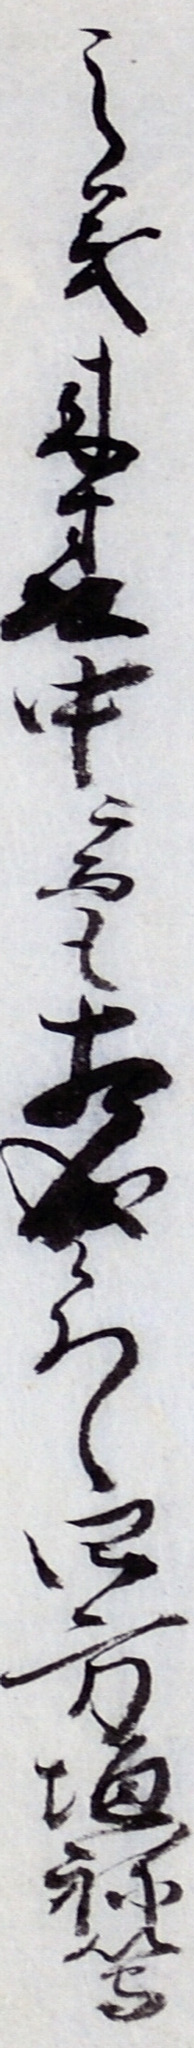之義来春中ニ而も相成候ハヽ四方垣ね等
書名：御林御竹藪証文控
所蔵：伊那市立高遠町図書館・合同会社AMANE
